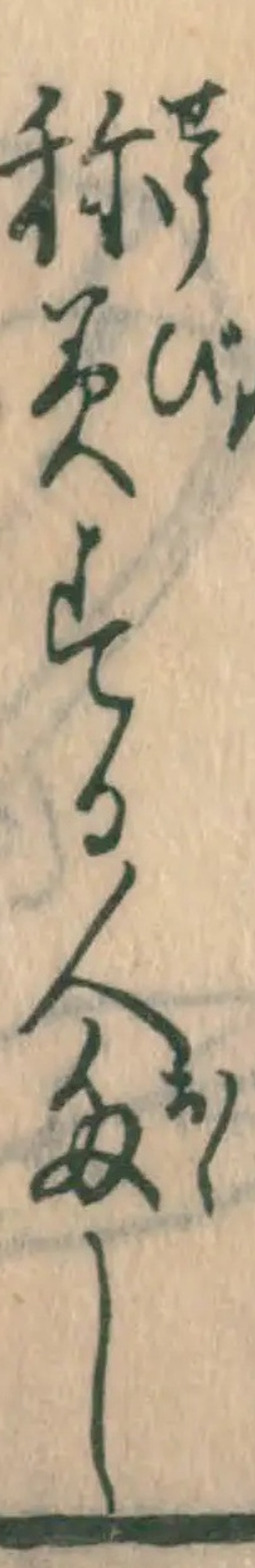称美する人多し
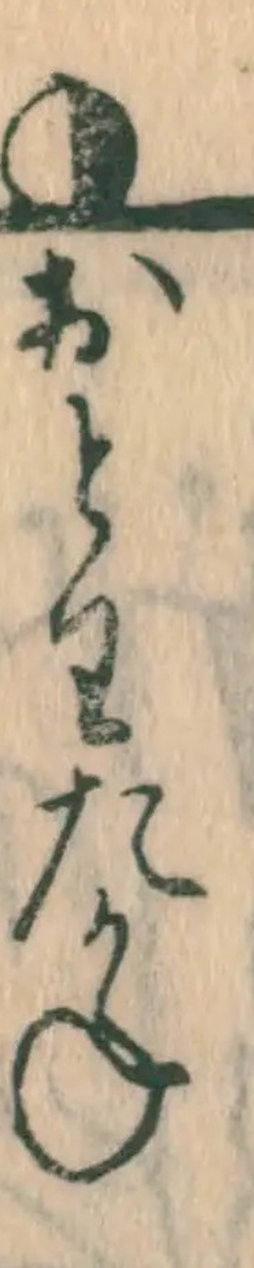おとわたかね
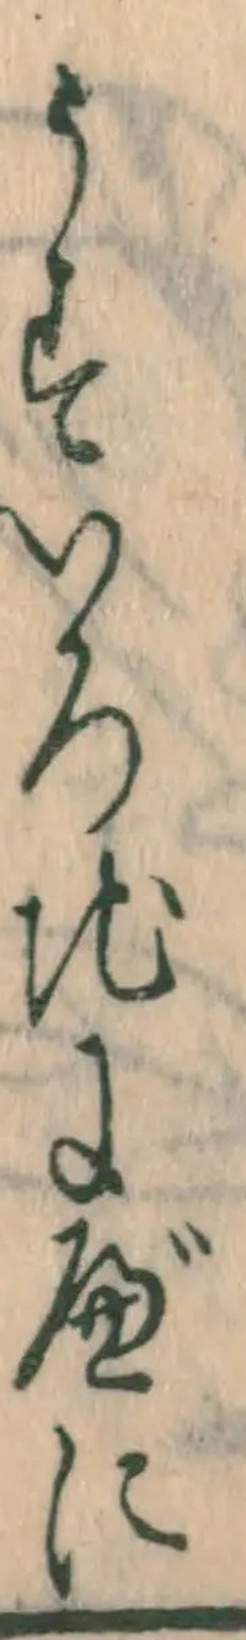うすいろ地にべに
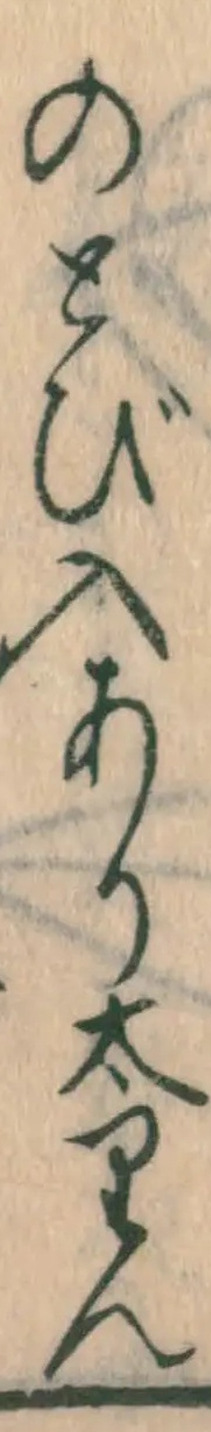のとび入あり太りん
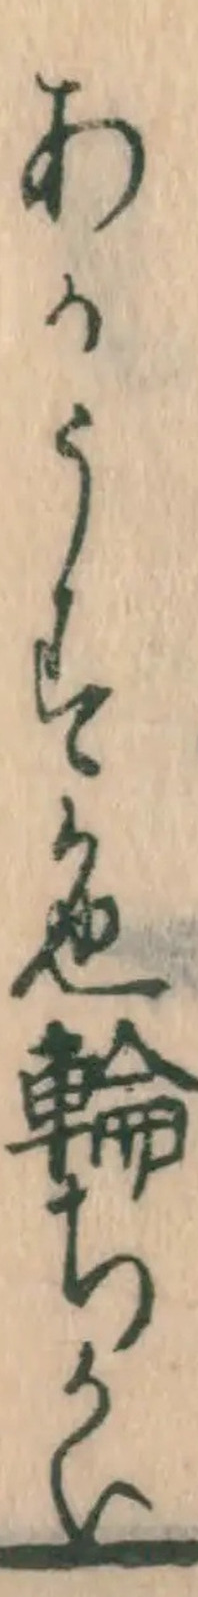あかうす色輪ちかい
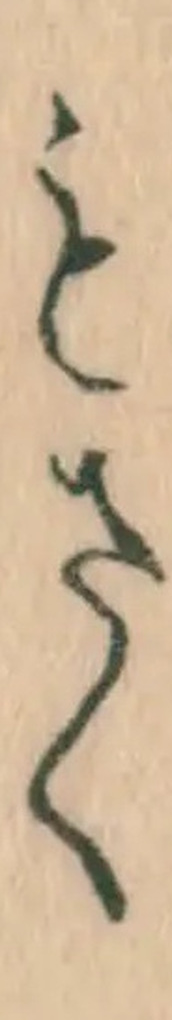もさく
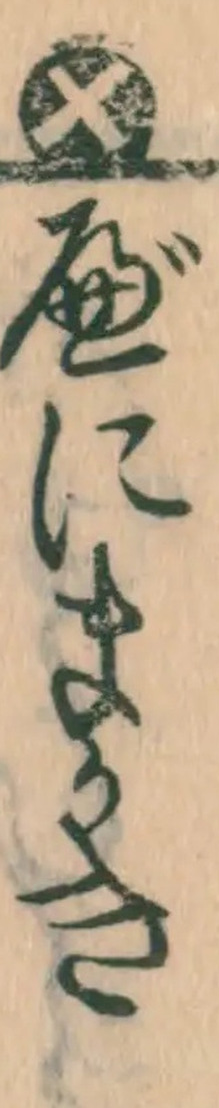べにまかき
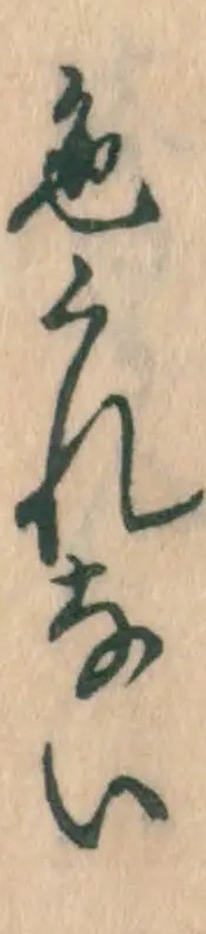色くれない

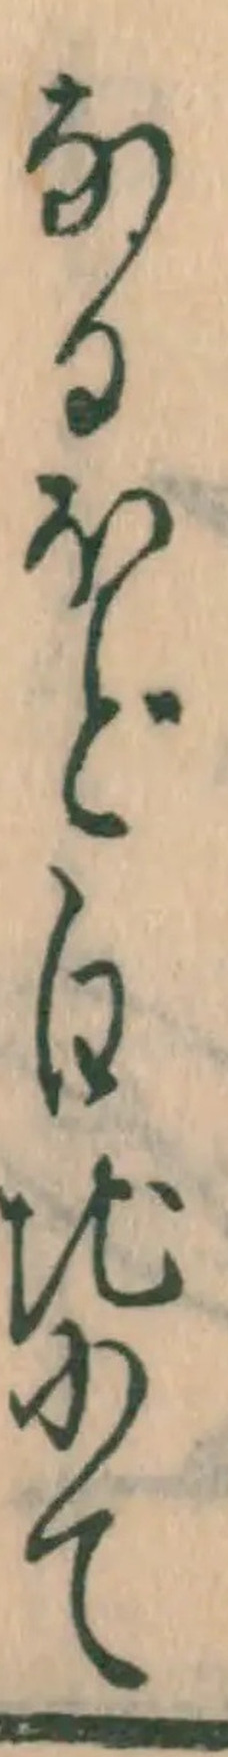なるほど白地にて
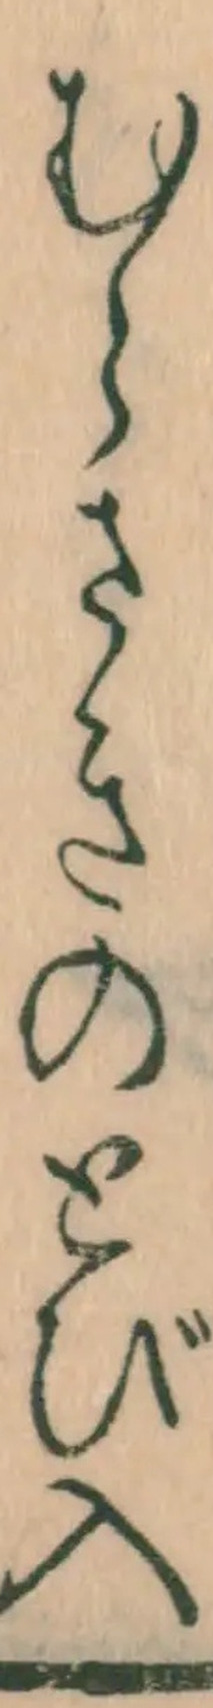むらさきのとび入
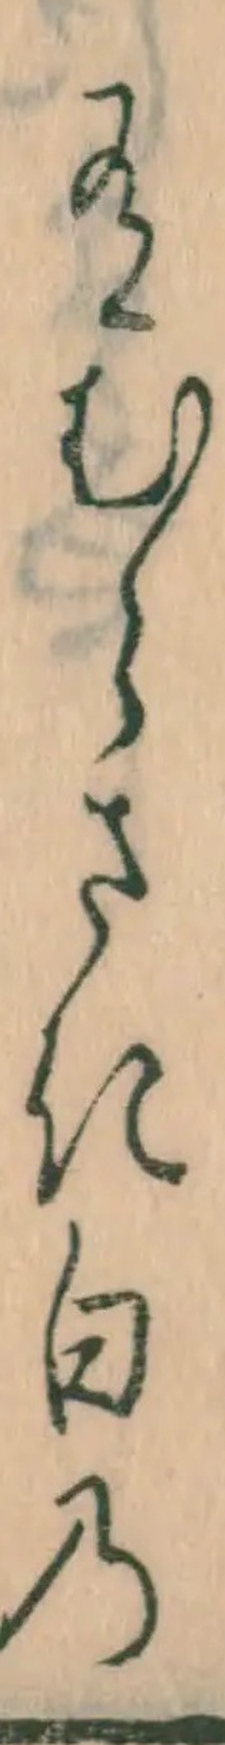有むらさき白の
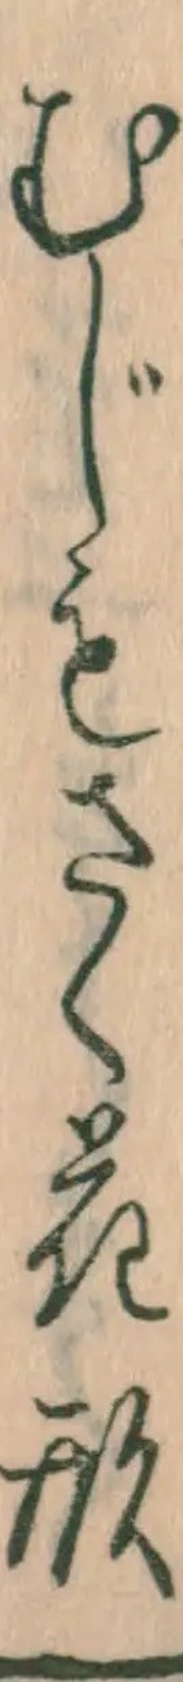むじもさく花形
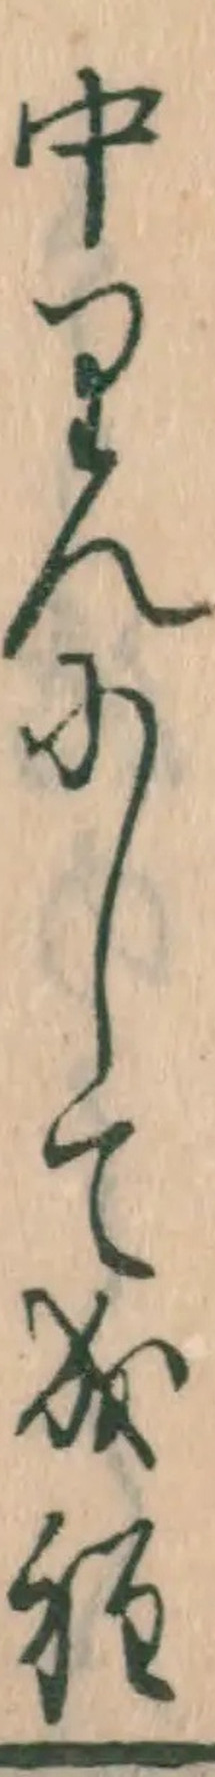中りんにして成程
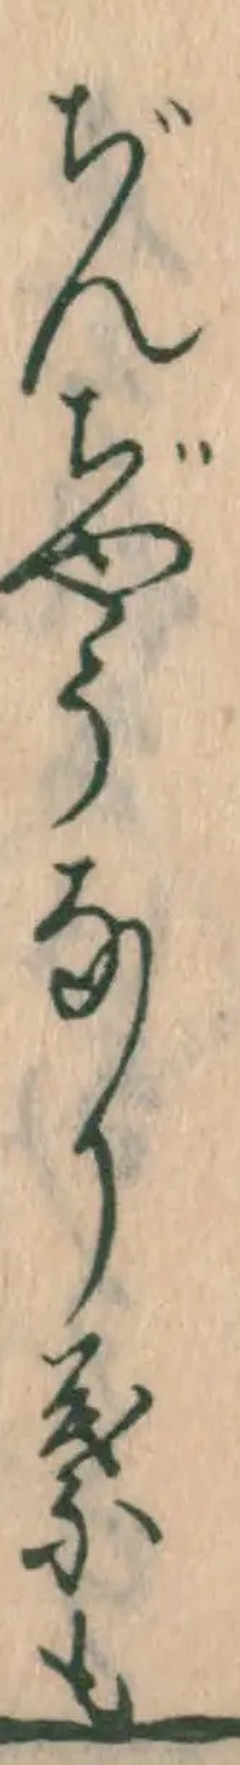ぢんぢやうなり葉も
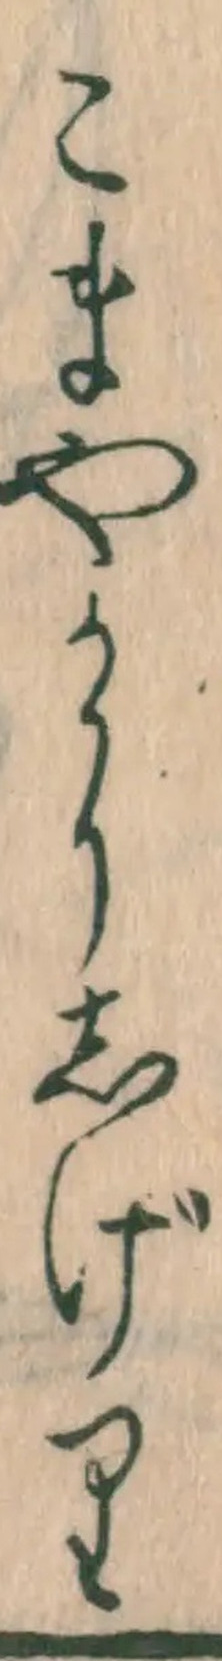こまやかにしげり
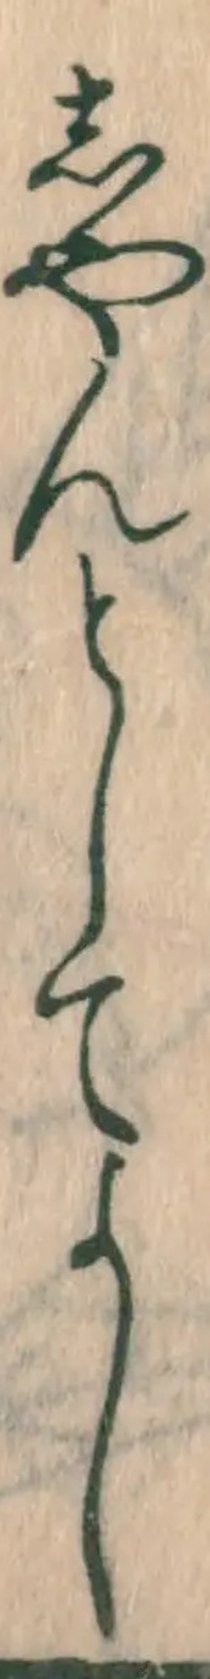しやんとしてよし
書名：錦繍枕 5巻. [5]
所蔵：国立国会図書館 National Diet Library, JAPAN
